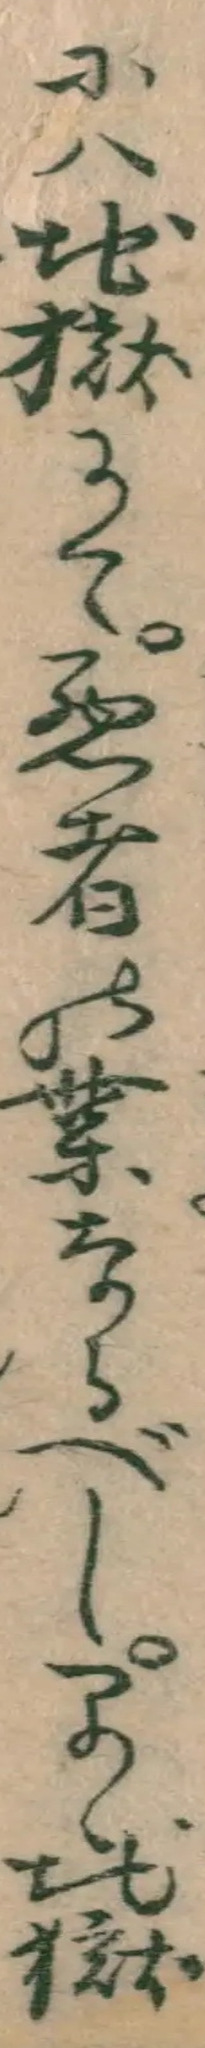には地獄にて。悪者の業なるべし。早々地獄
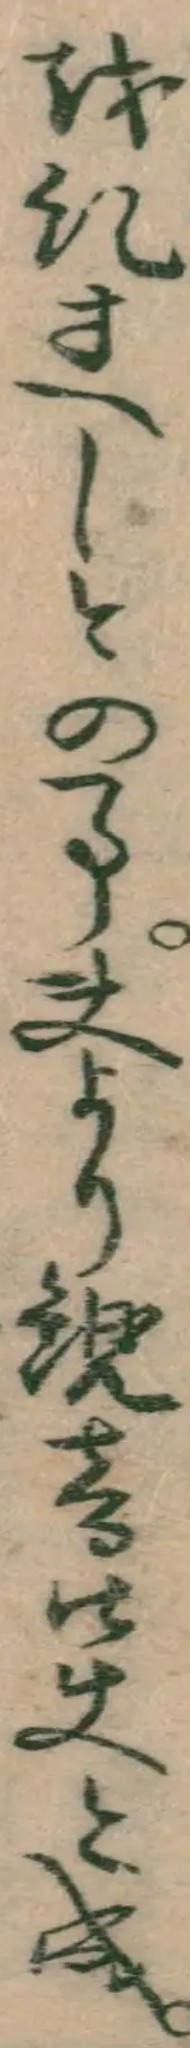を糺すへしとの事。夫より観音御使と成。
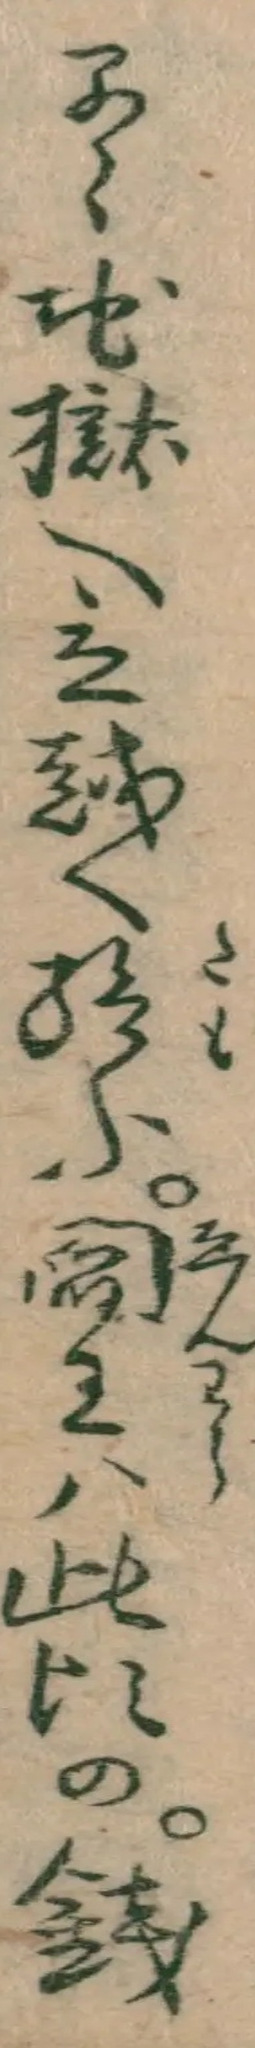早々地獄へ立越へ給ふ。閻王は此頃の。銭
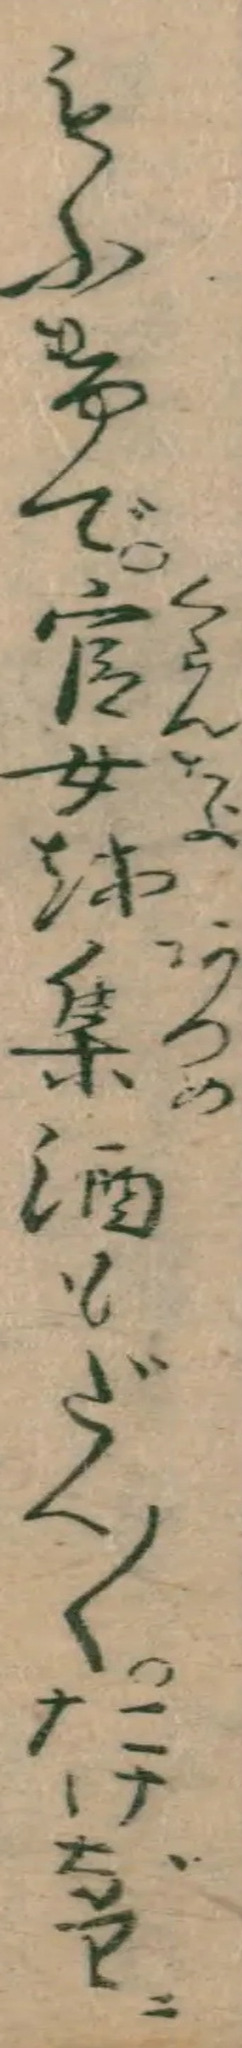もふけで。官女を集酒もだん〳〵。たけなわ
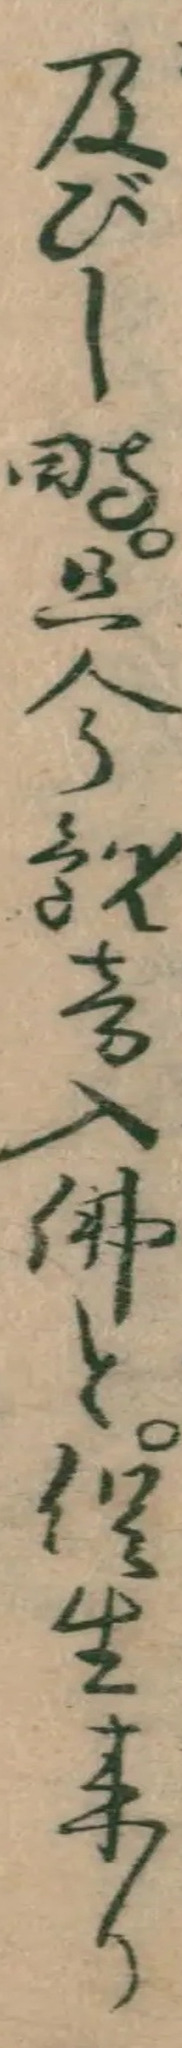及びし時。只今観音入仏と。俱生来り
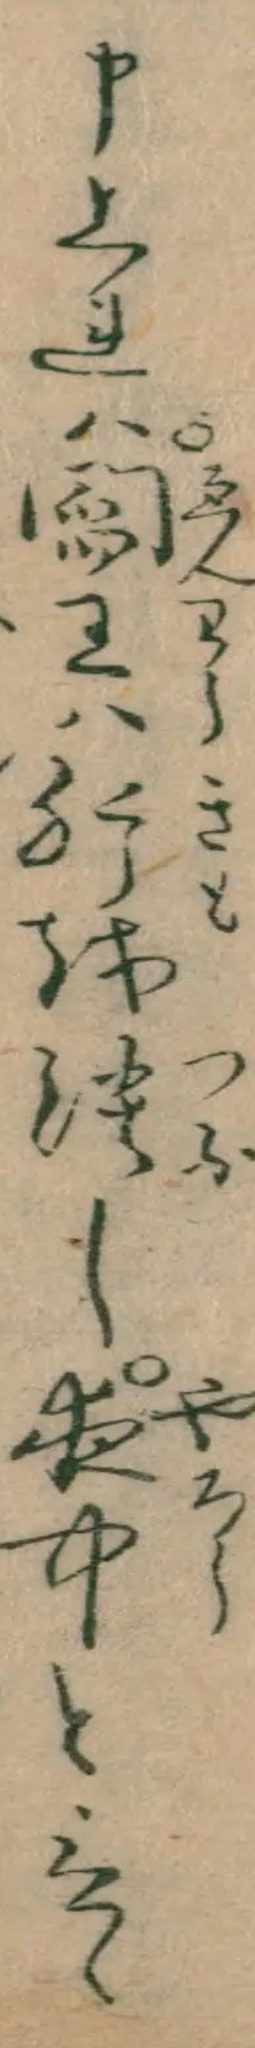申上れは。閻王は肝を潰し。夜中と言ゝ
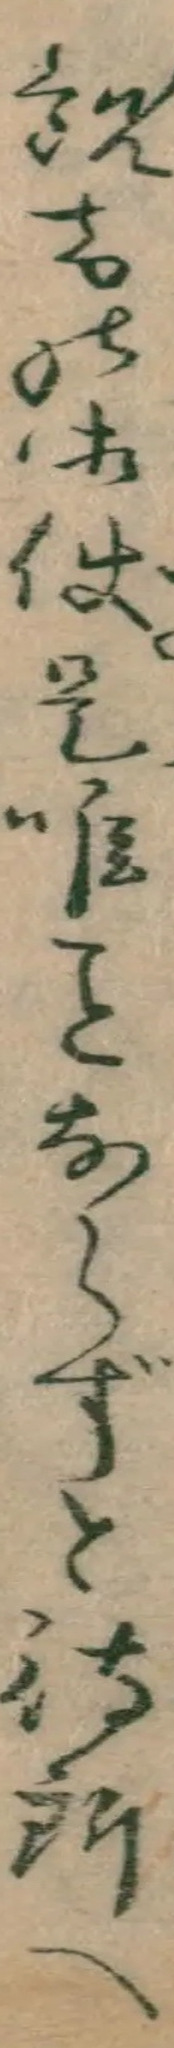観音の御使。是唯ことならずと待所へ。
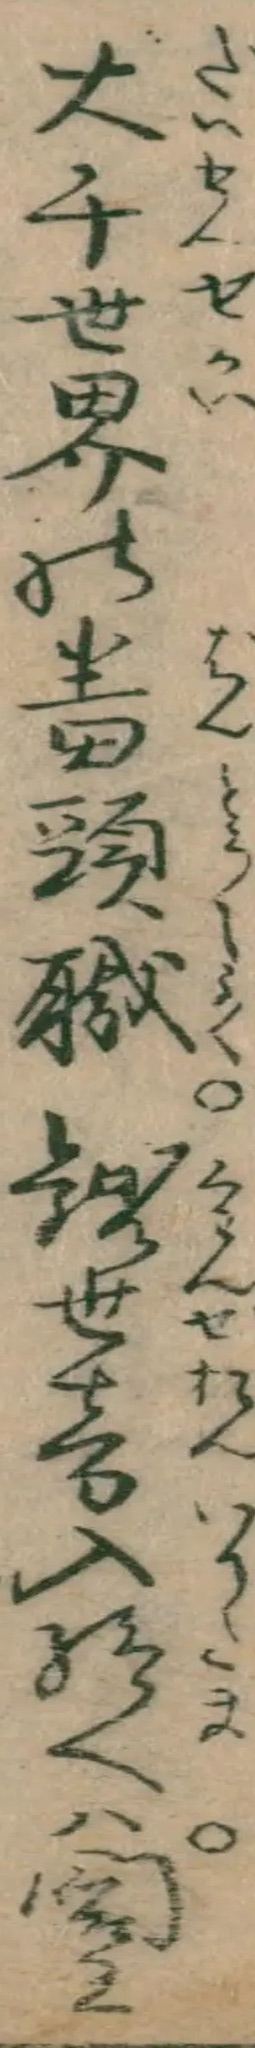大千世界の番頭職。観世音入給へは。閻王
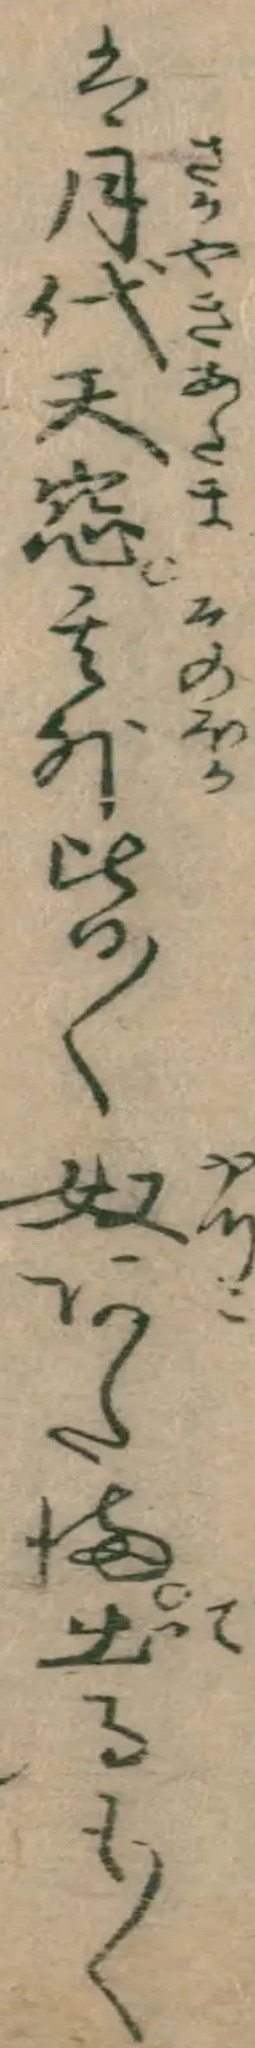は月代天窓。其外皆〳〵奴あたま。出るも〳〵
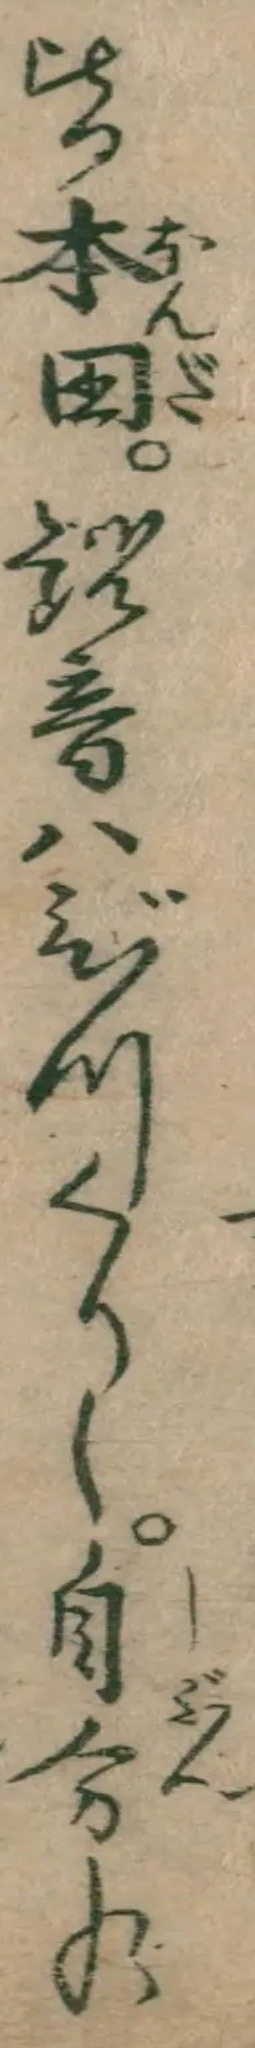皆本田。観音はびつくりし。自分の
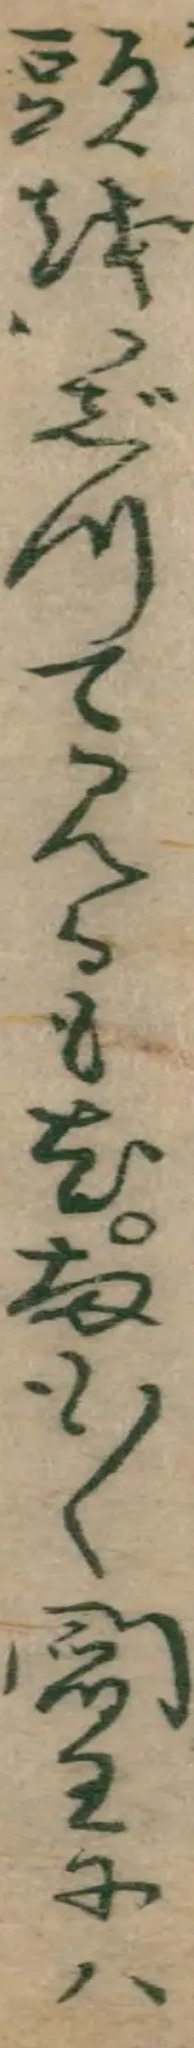頭をいじつて見るも尤。扨も〳〵閻王には

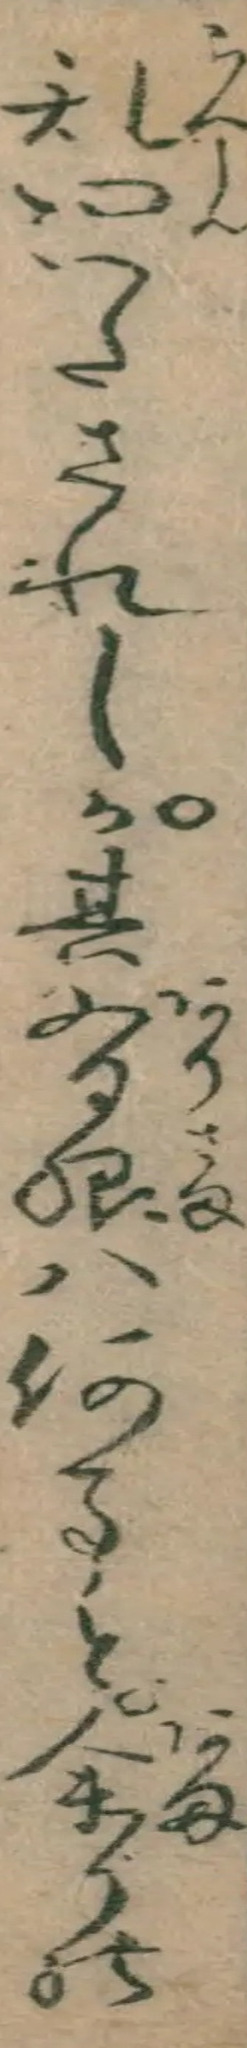乱心いたされしか。其有様は何事と。余りの
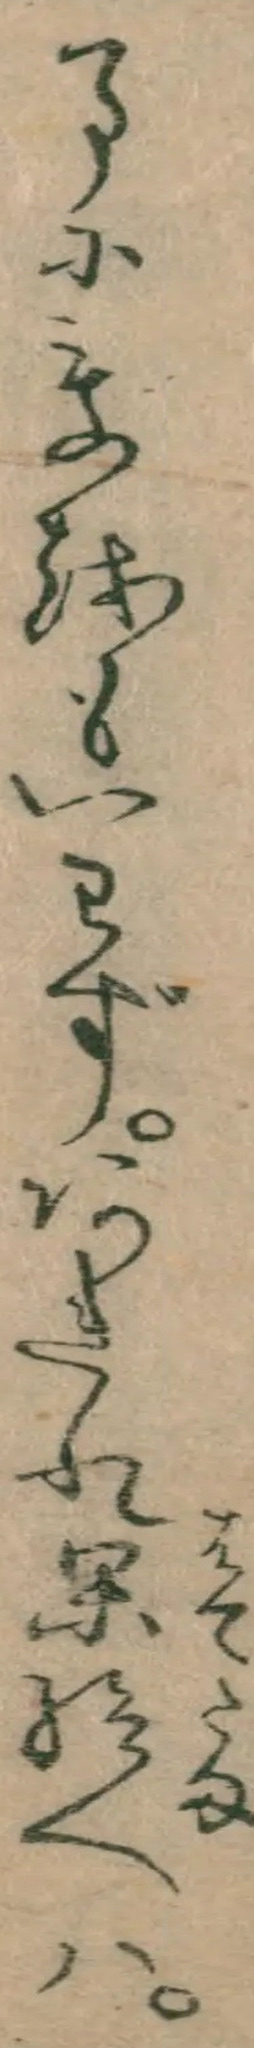事にものをもいわず。あきれ果給へは。
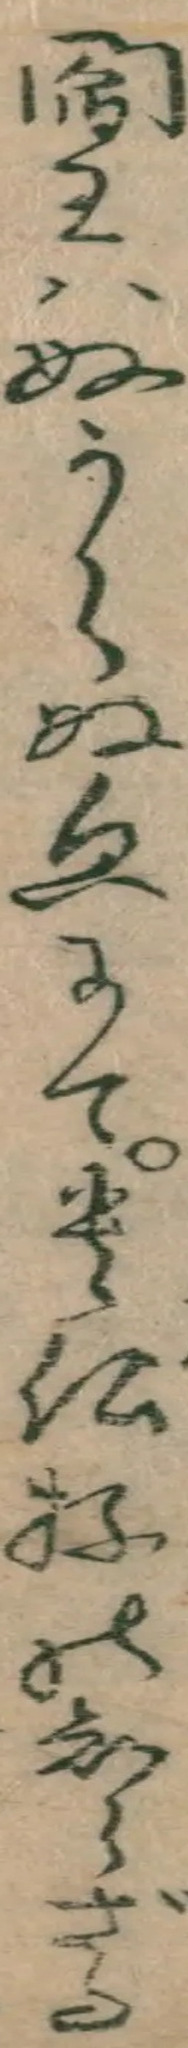閻王はぬからぬ皃にて。貴仏抔の知らざる
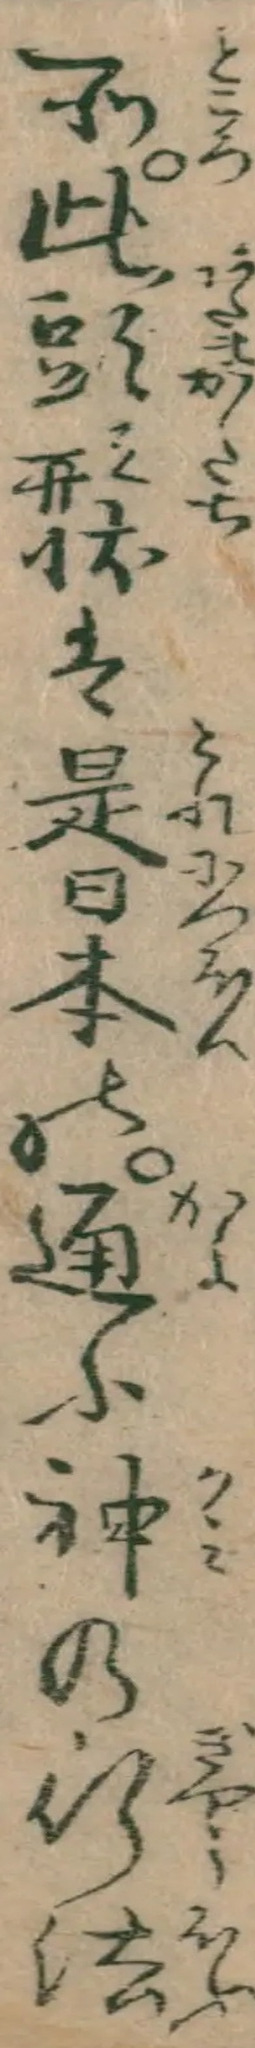所。此頭形状は是日本の。通ふ神の行法
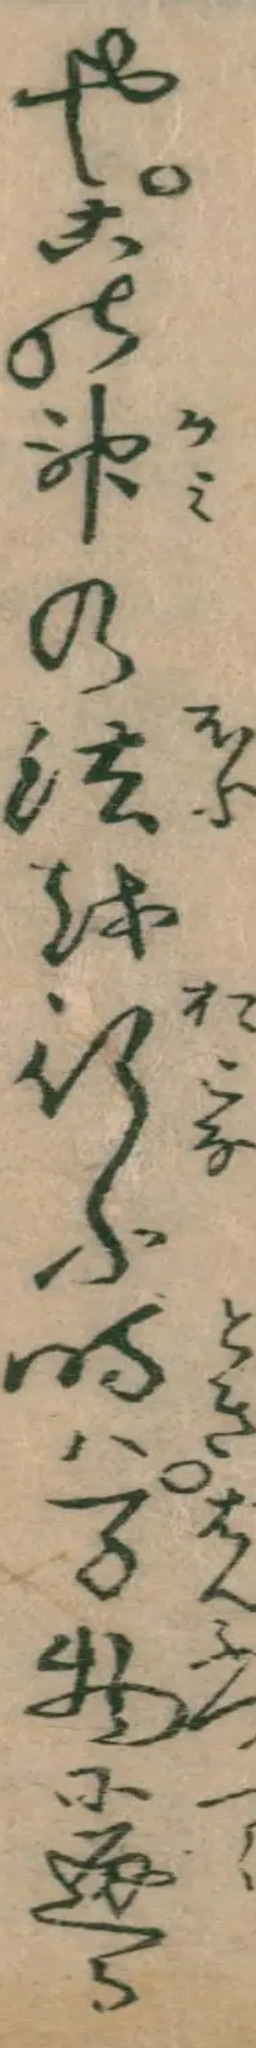也。この神の法を行ふ時は。万物に通る
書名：翻草盲目
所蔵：国立国会図書館 National Diet Library, JAPAN
